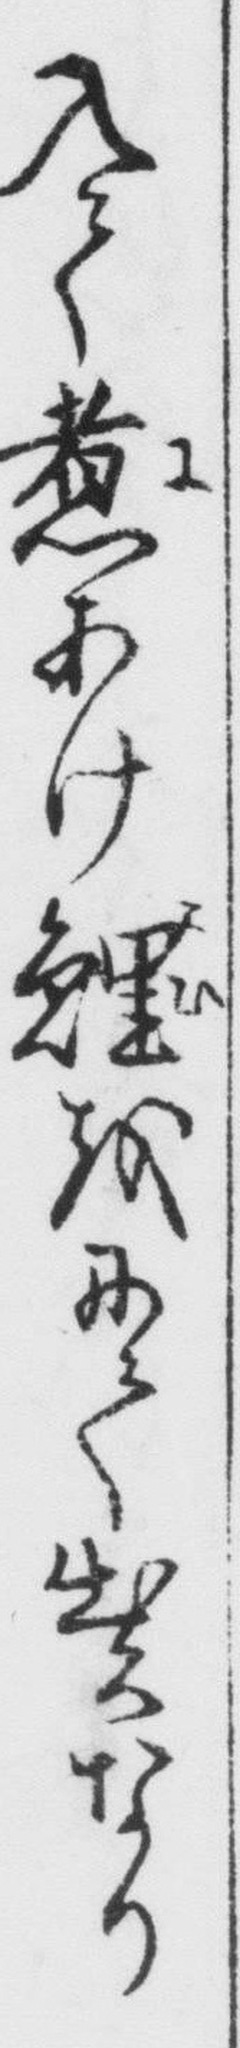入れて煮あけ鯉をにて出すなり
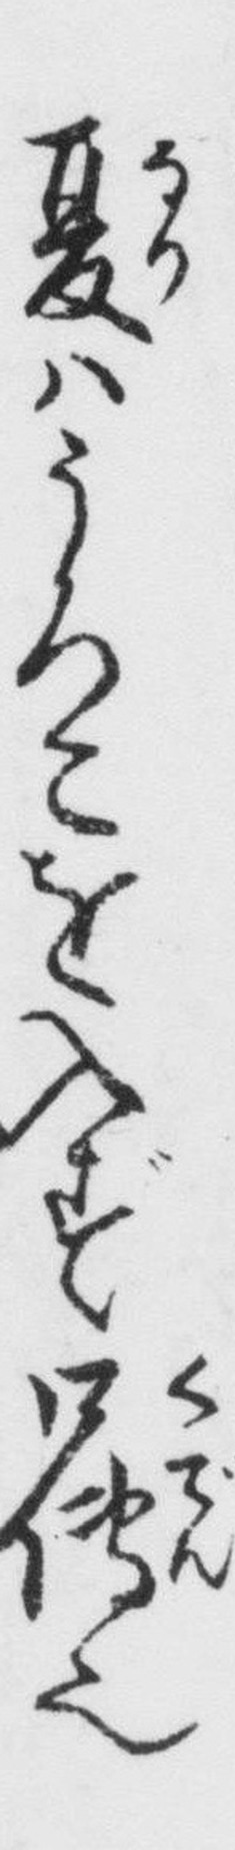夏はうろこを入れず口伝也
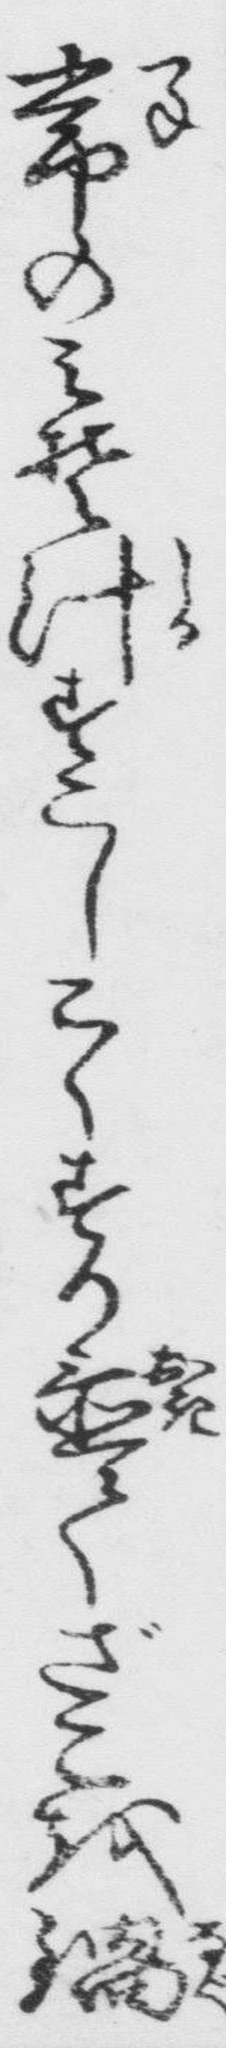常のみそ汁すこしこくすり置てざこを鍋
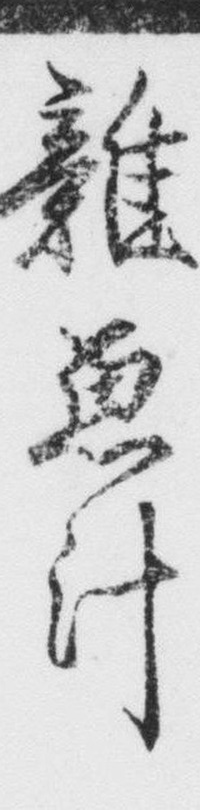雑魚汁
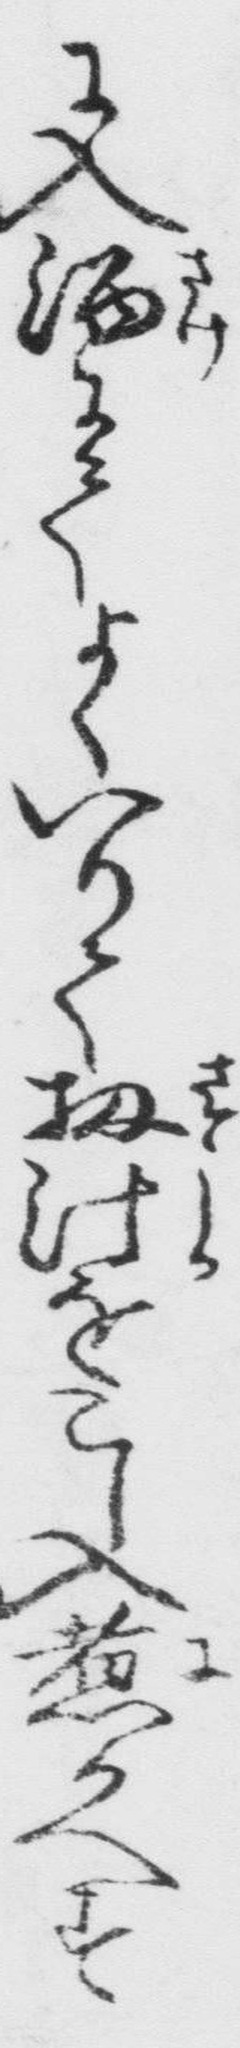に入酒にてよくいりて扨汁をこし入煮かへす
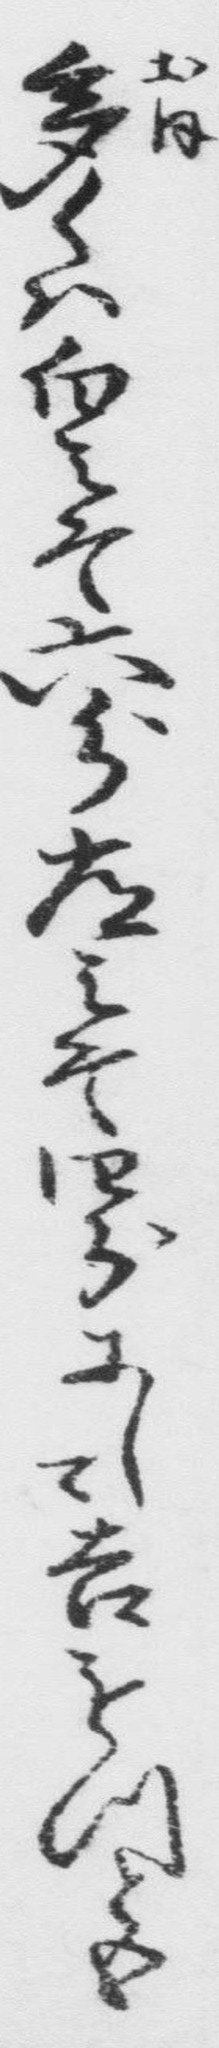多くは白みそ六分常みそ四分にて吉もつとも
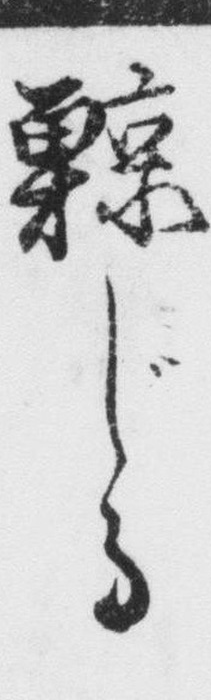鯨じる
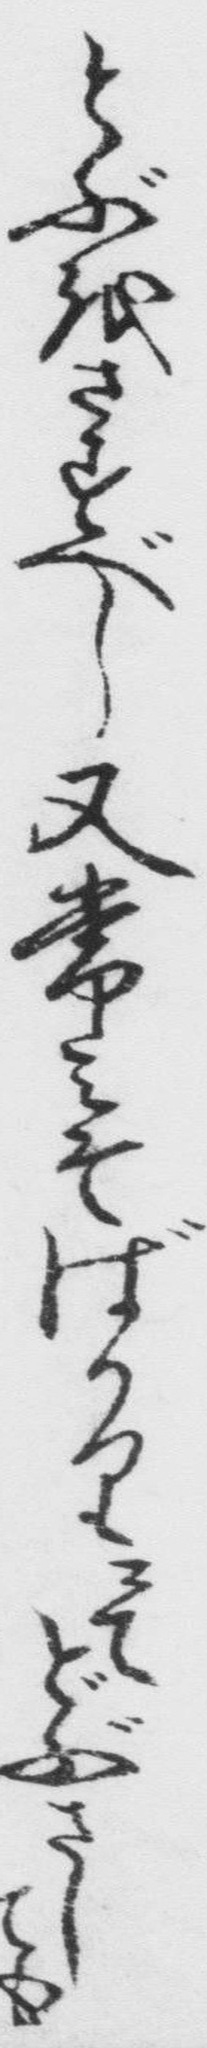とぶをさすべし又常みそばかりにてどぶさしても
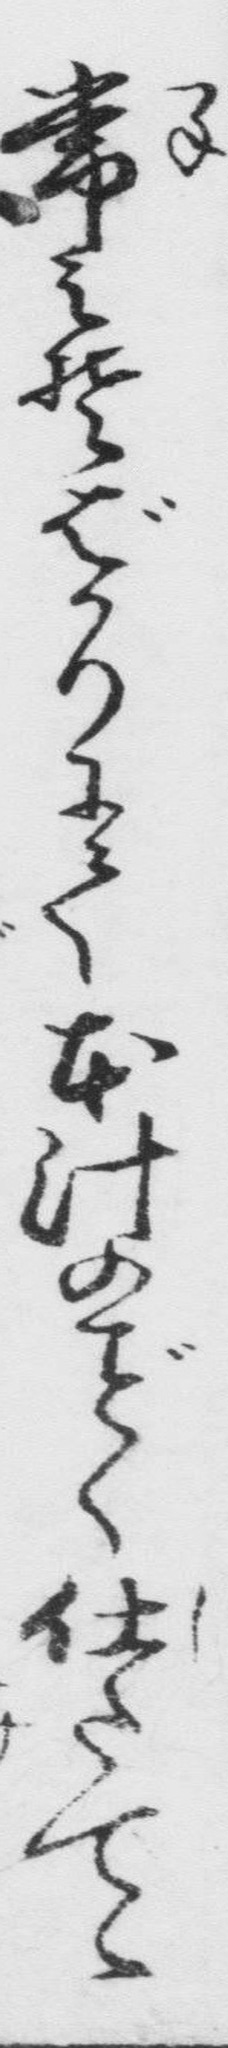常みそばかりにて本汁のごとく仕たてゝ

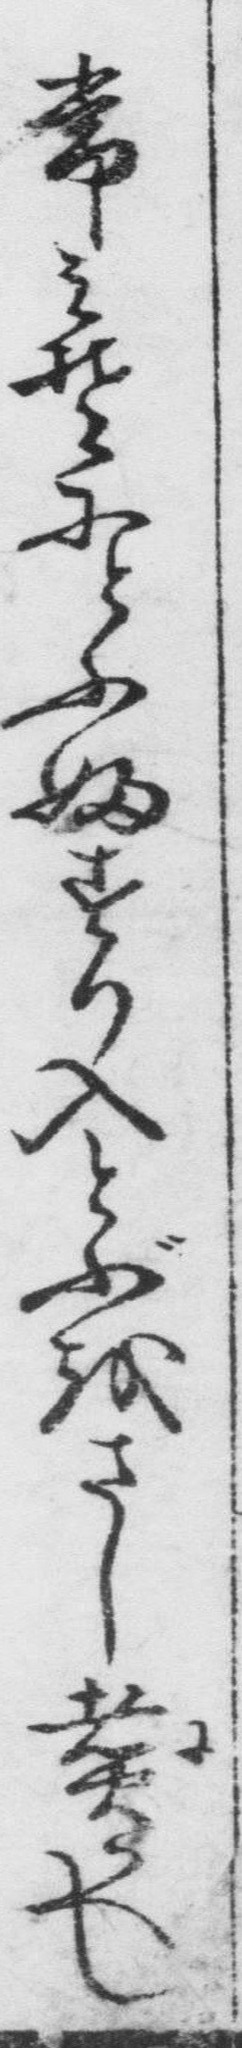常みそにとふふすり入とぶをさし煮かへし
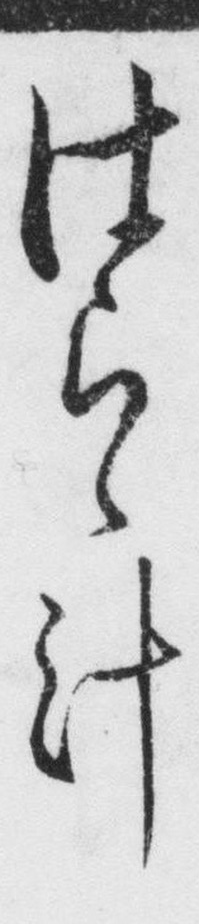さらゝ汁
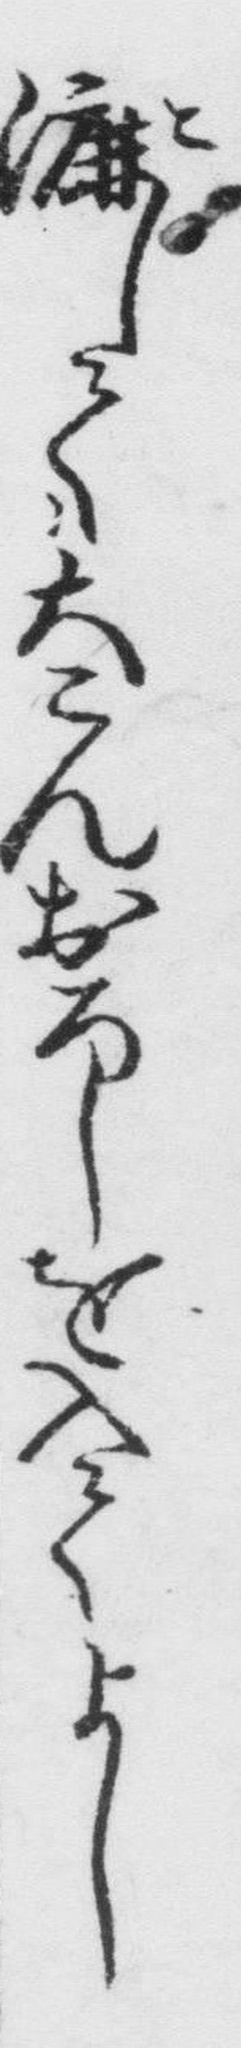漉して大こんおろしを入てよし
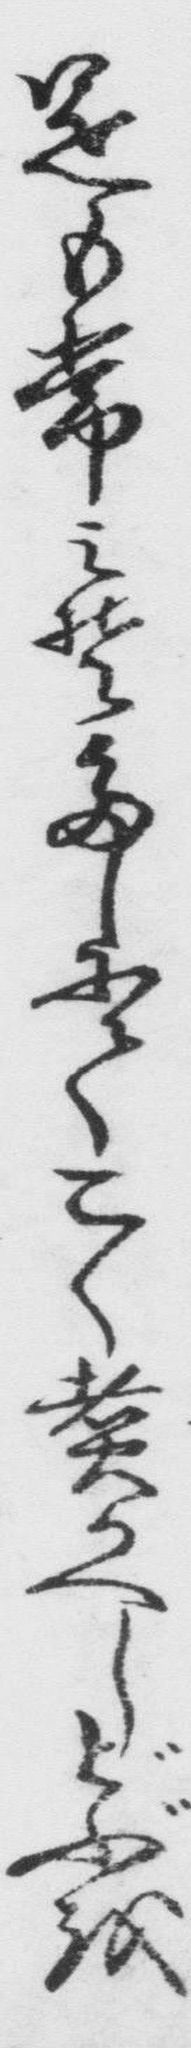是も常みそたしにてこく煮かへしどぶを
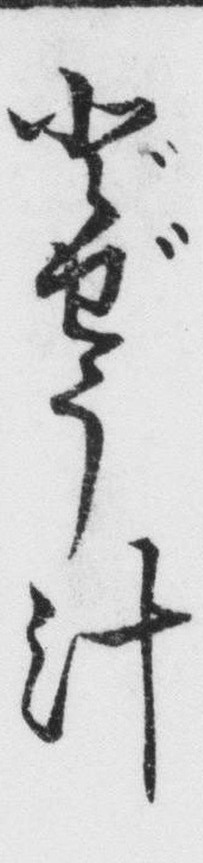どぜう汁
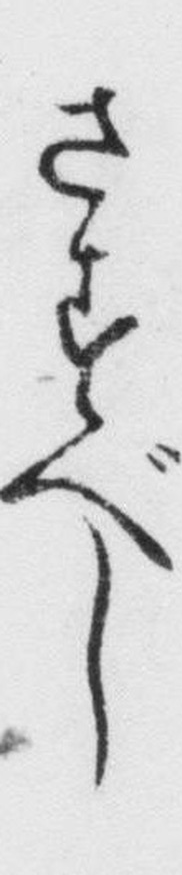さすべし
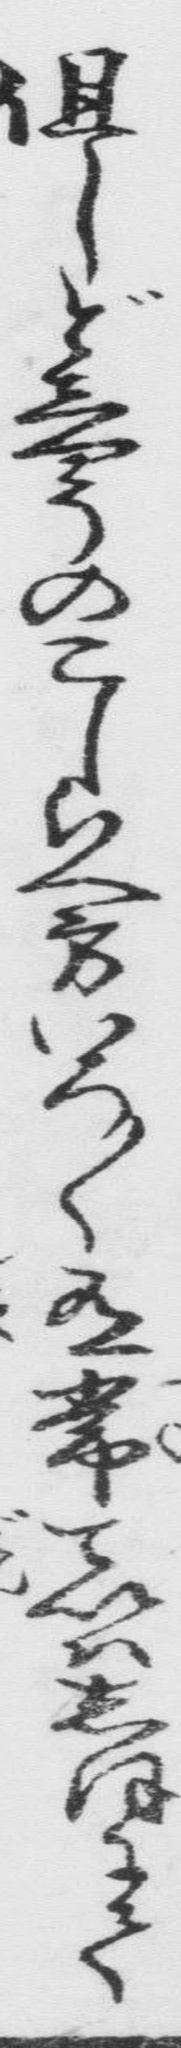但しどしやうのこしらへ方いろ〳〵有常ていはしほにて
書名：料理早指南
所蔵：大阪府立大学学術情報センター 国文学研究資料館
